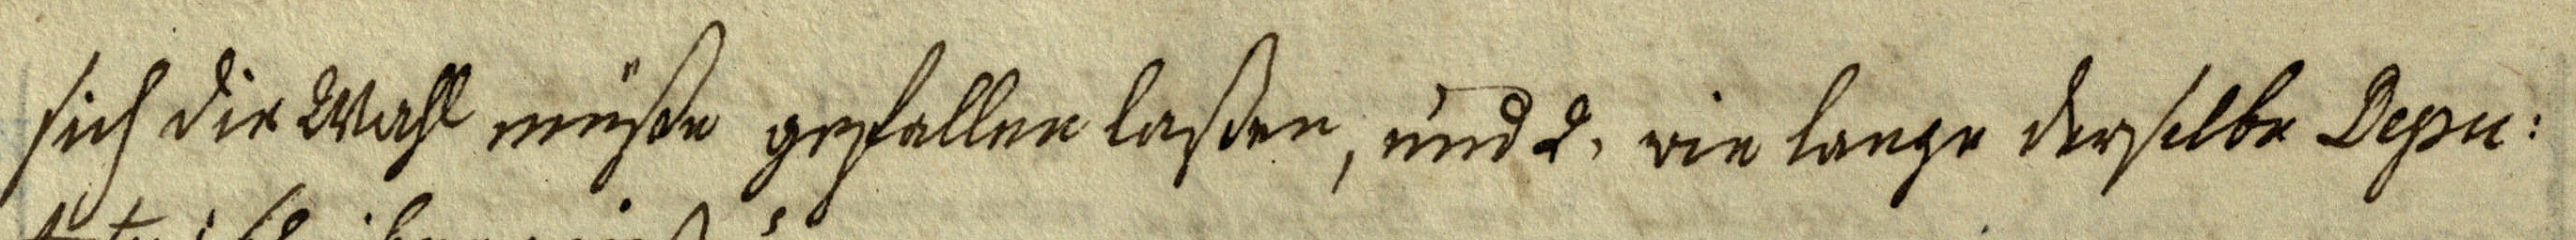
sich die Wahl müße gefallen laßen, und 2. wie lange derselbe Depu¬¬
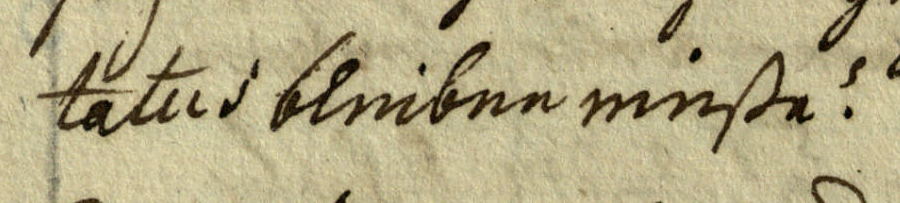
tatus bleiben müße?
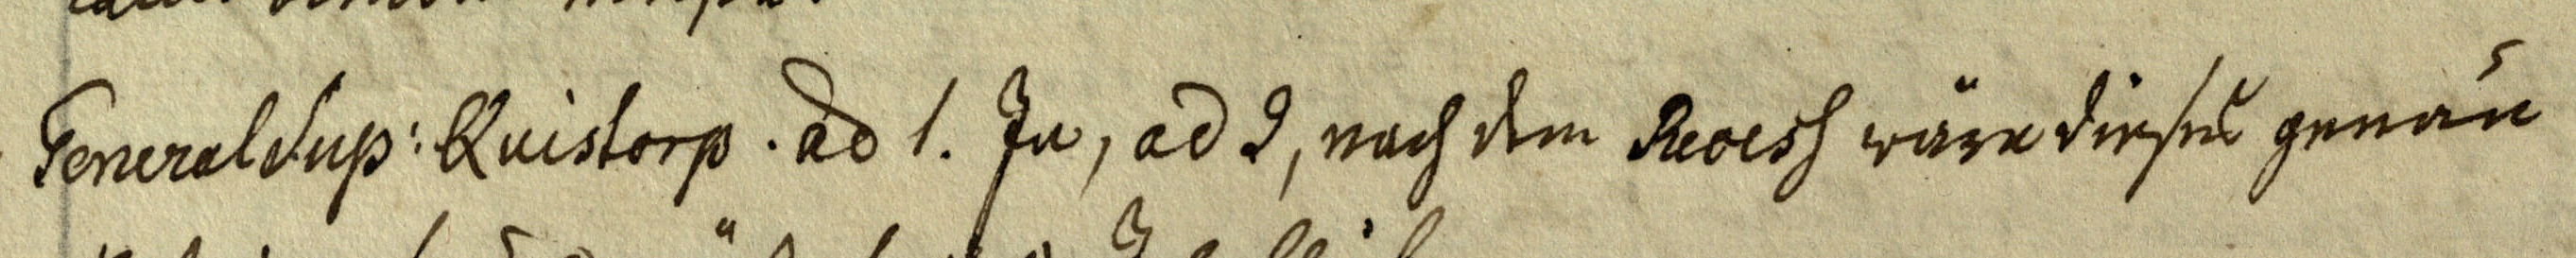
dh GeneralSup. Quistorp ad 1. Ja, ad 2, nach dem Recess wäre dieses genau
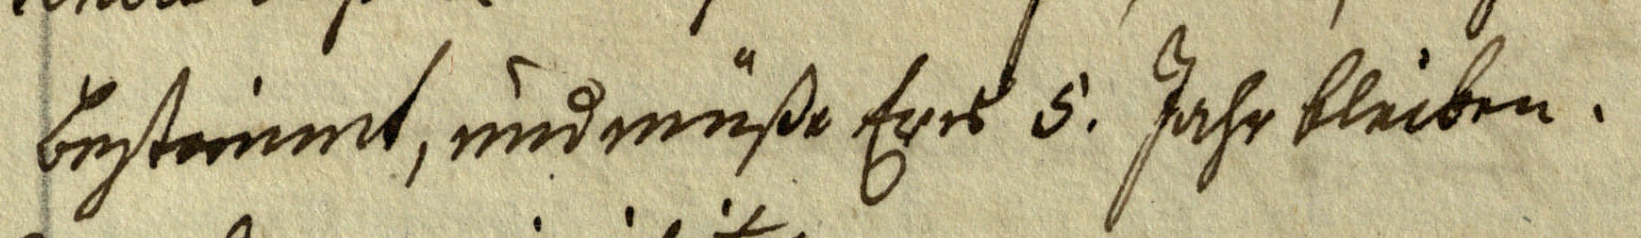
bestimmt, und müße Er 5. Jahr bleiben.
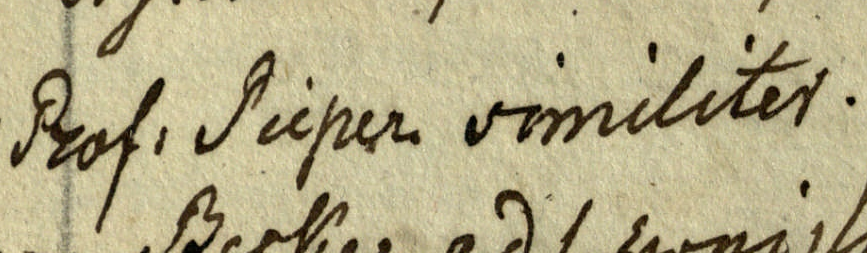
dh Prof. Pieper similiter.
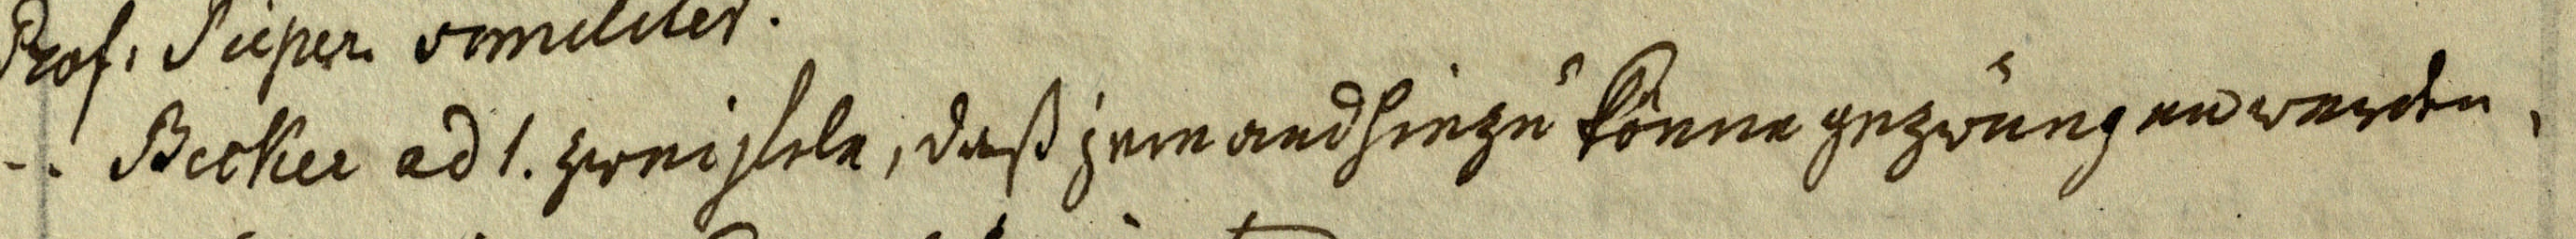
Becker ad 1. zweifele, daß jemand hiezu könne gezwungen werden,
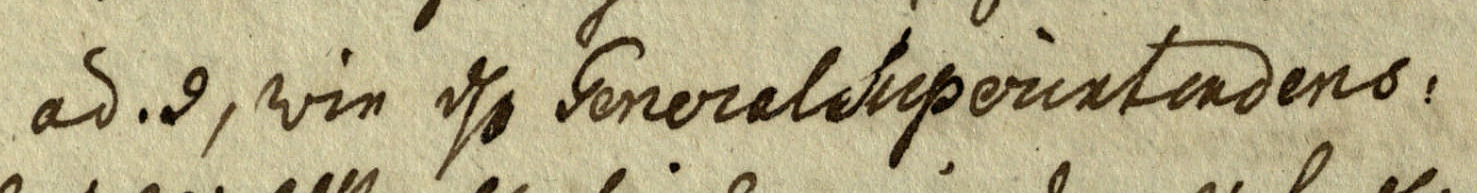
ad 2, wie dh GeneralSuperintendens
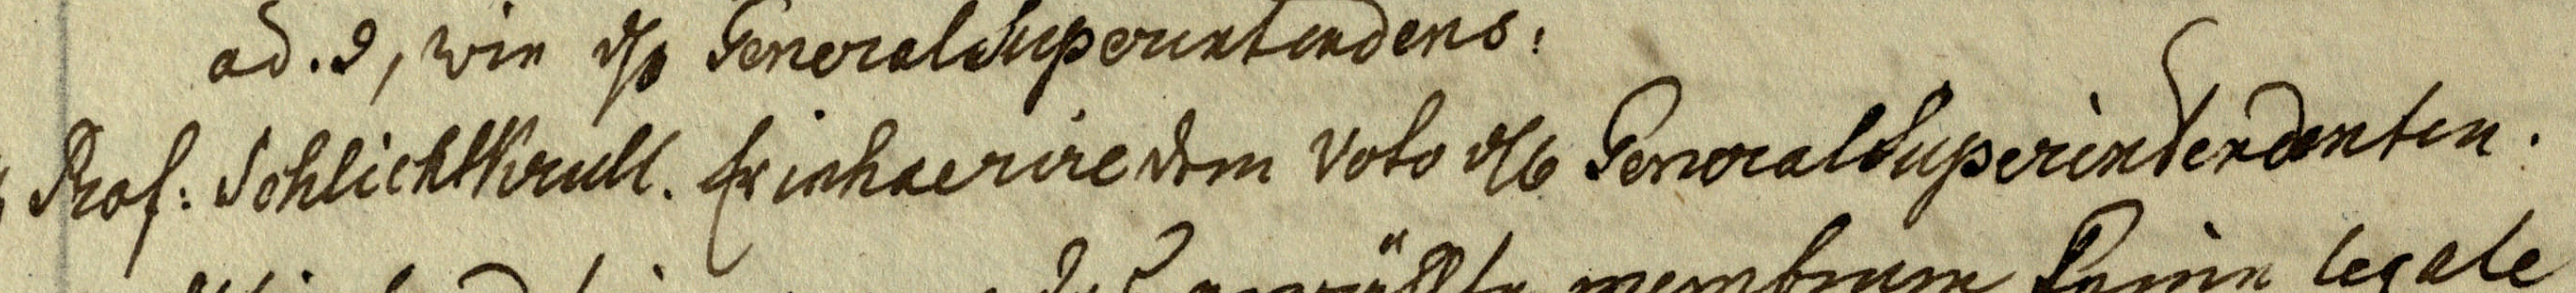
dh Prof. Schlichtkrull. Er inhaerire dem voto dh. GeneralSuperintendenten.
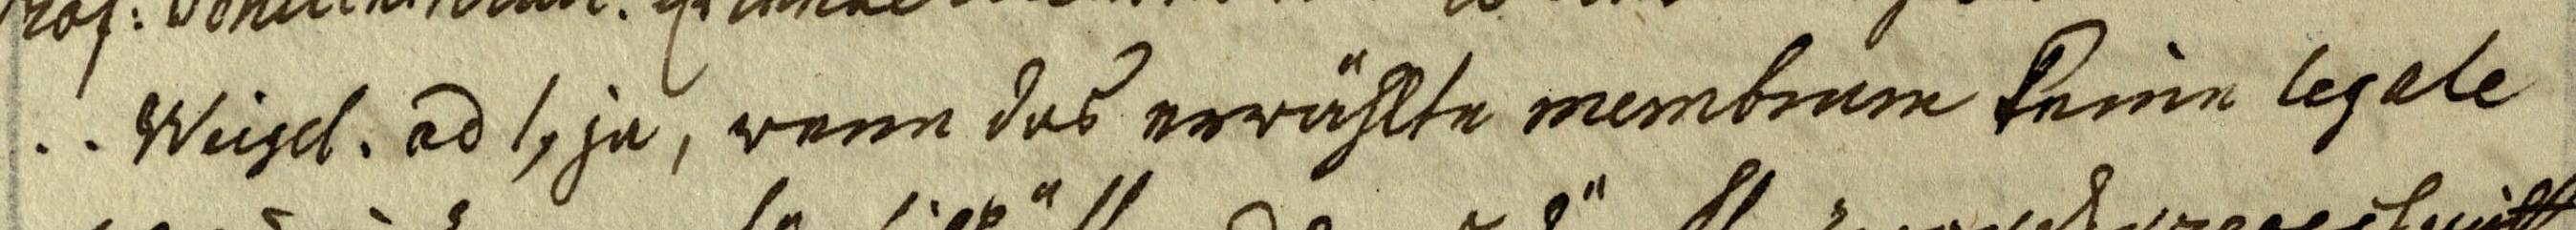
Weigel. ad 1, ja, wenn das erwählte membrum keine legale
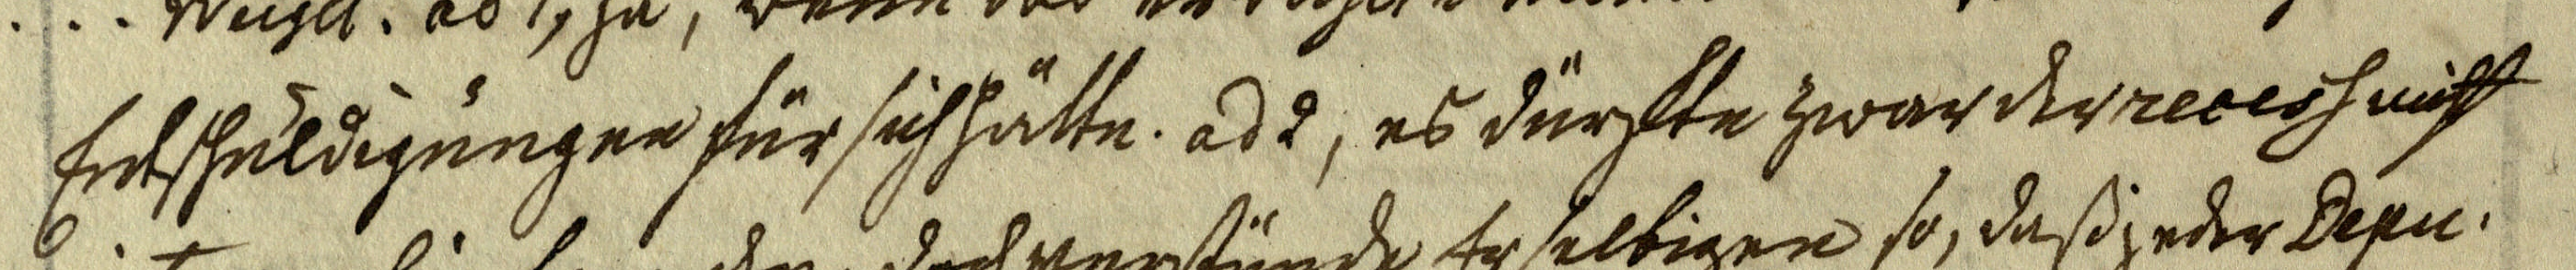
Ertschuldigungen für sich hätte. ad 2, es dürfte zwar der recess nicht
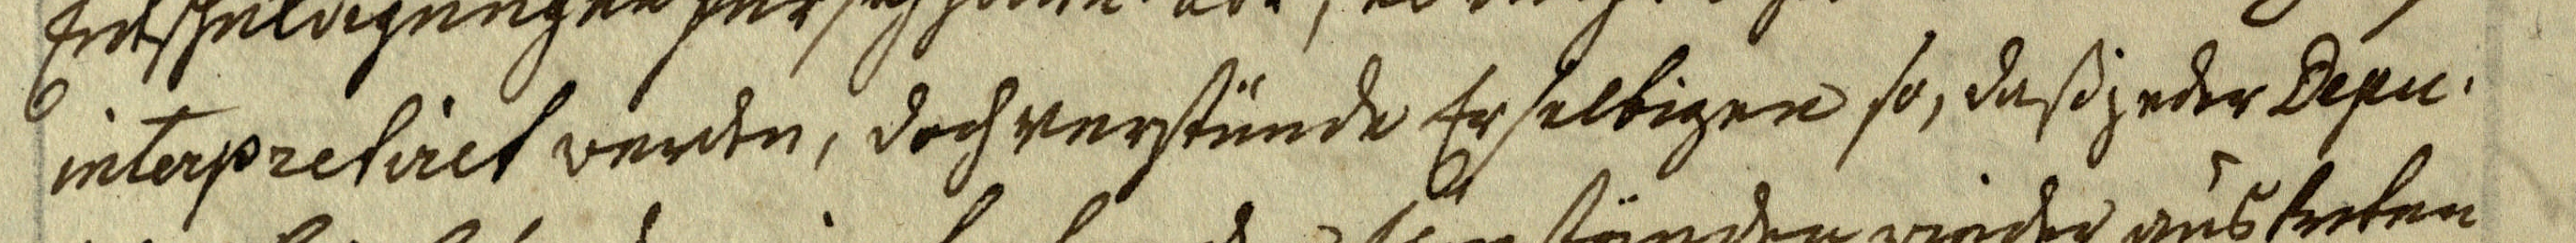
interpretiret werden, doch verstünde Er selbigen so, daß jeder Depu¬
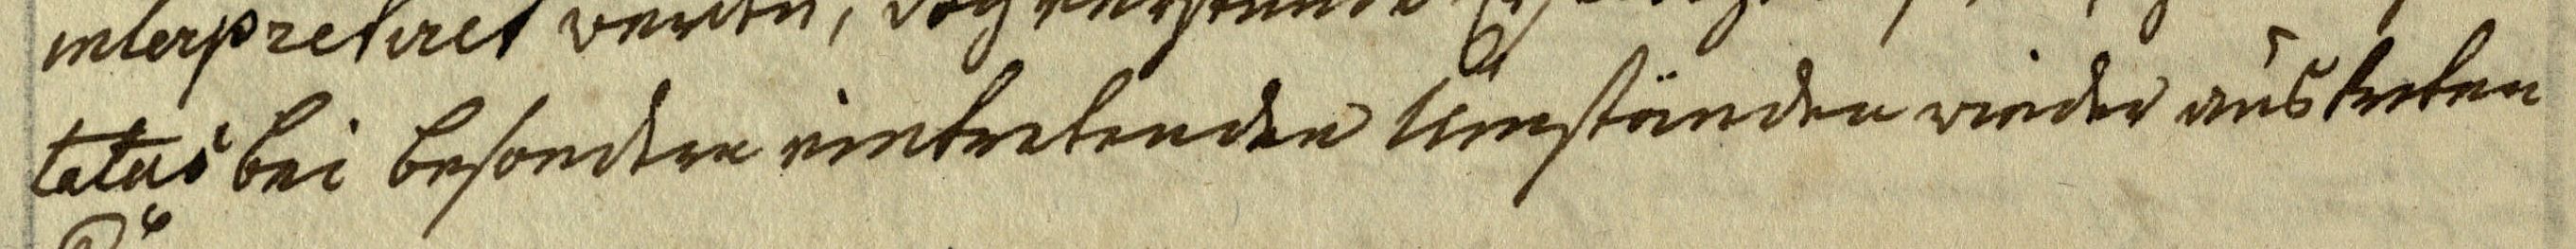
tatus bei besondern eintretenden Umständen wieder austreten
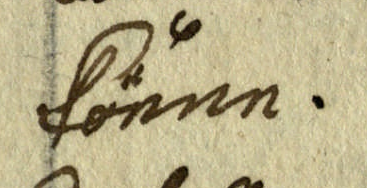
könne.
